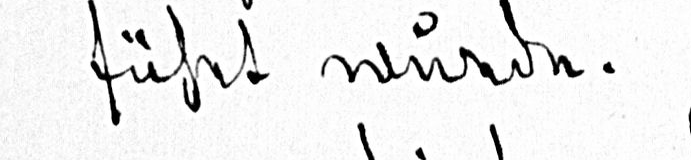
führt wurde.
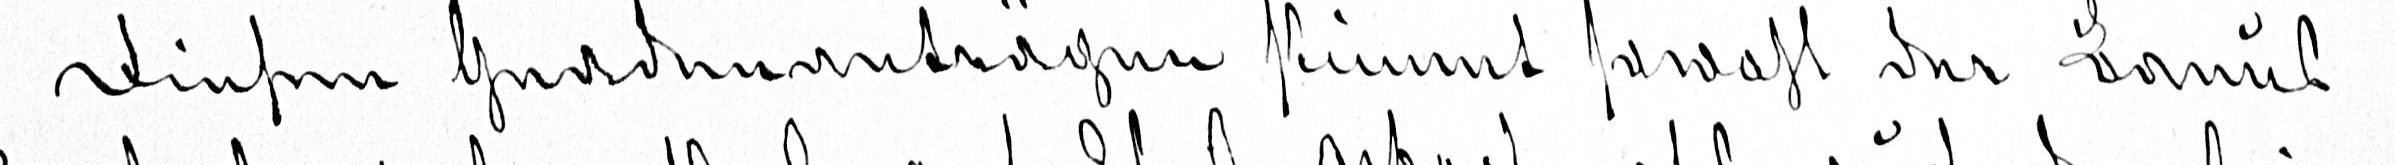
Diesen Gnadenanträgen stimmt sowohl der Banus
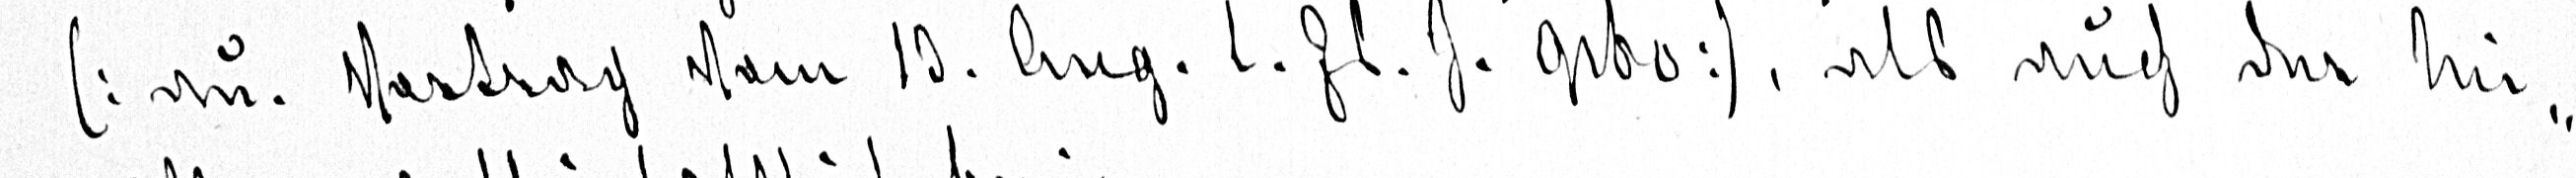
(: au. Vortrag vom 13. Aug. l. Js. Z. 9160:), als auch der Mi¬
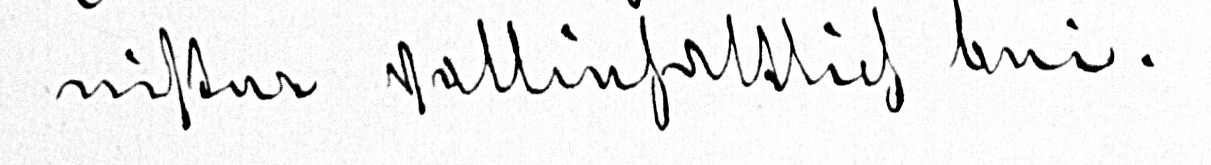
nister vollinhaltlich bei.
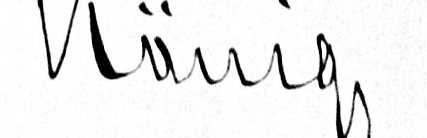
König
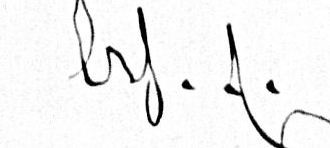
Ah. E.
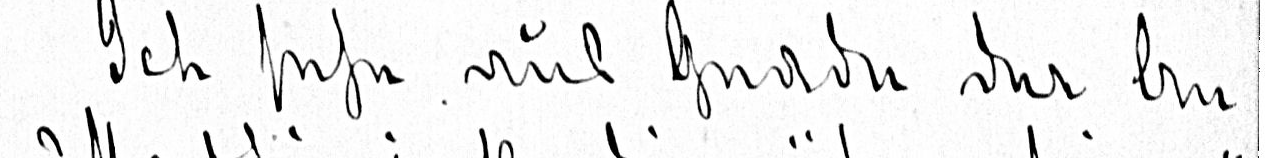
Ich sehe aus Gnade der An¬
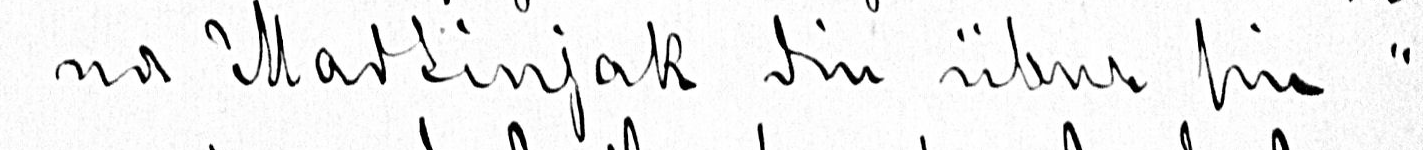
na Martinjak die über sie
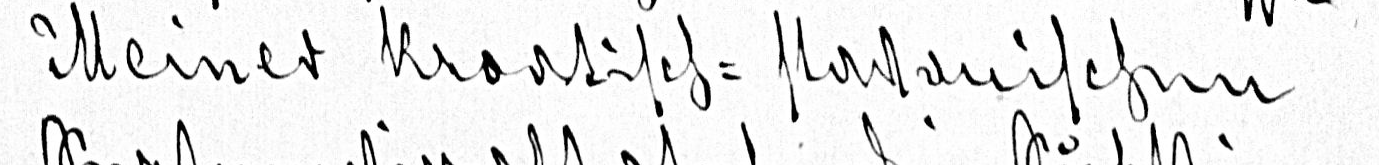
Meiner kroatisch-slavonischen
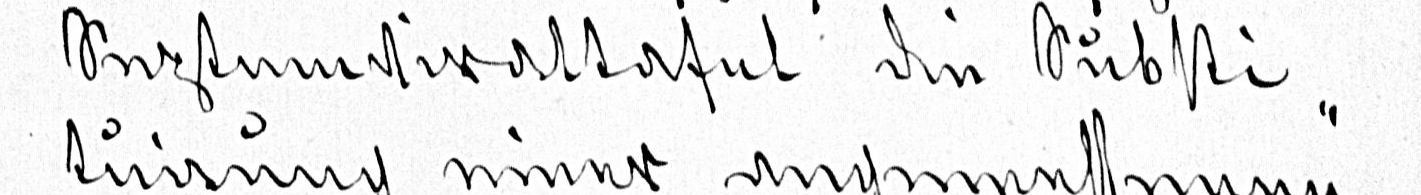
Septemviraltafel die Substi¬
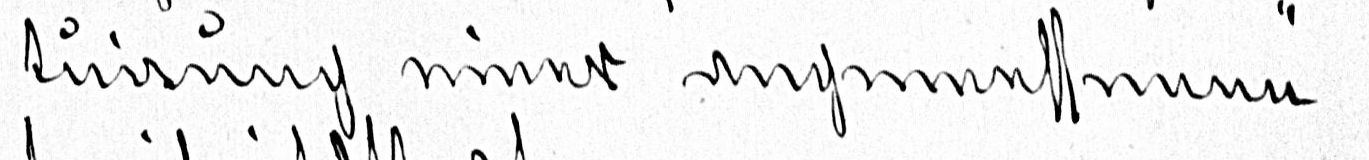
tuirung einer angemessenen
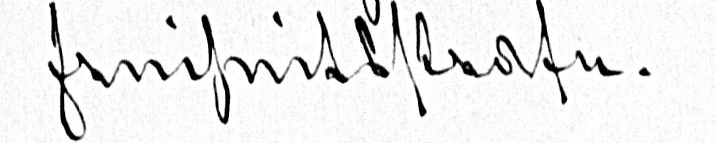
Freiheitsstrafe.
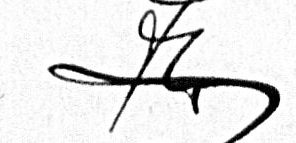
xx
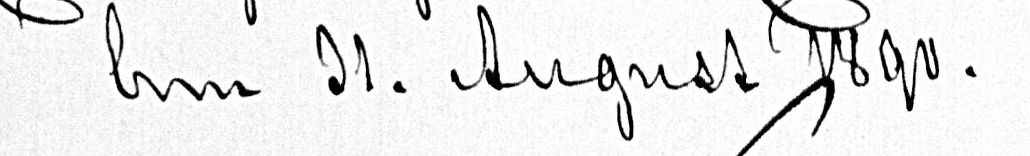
Am 31. August 1890.
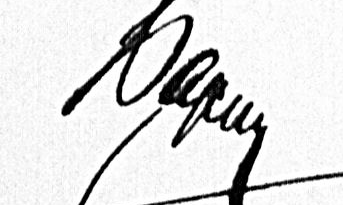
xx
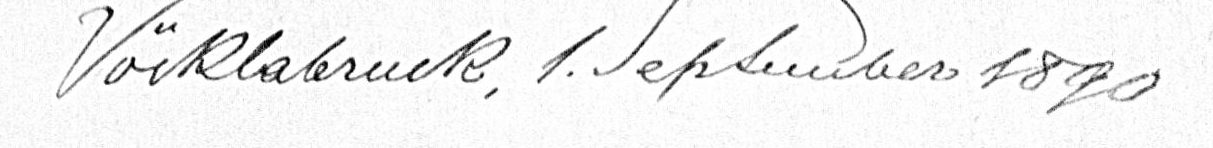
Vöcklabruck, 1. September 1890
